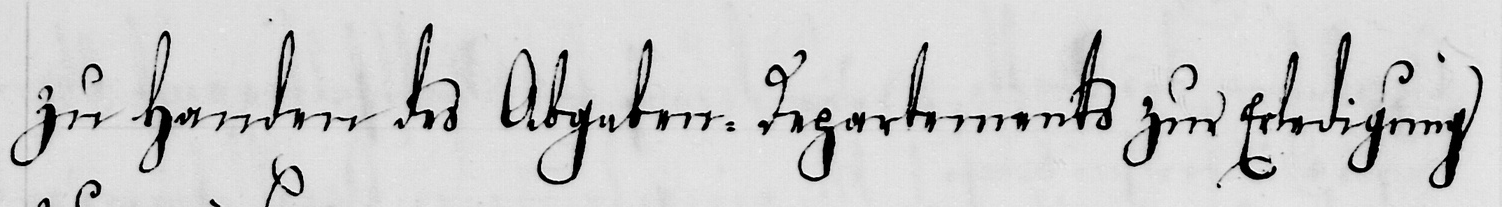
zu Handen des Abgaben-Departements zur Erledigung
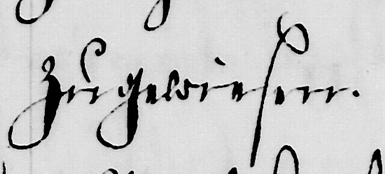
zugewiesen.
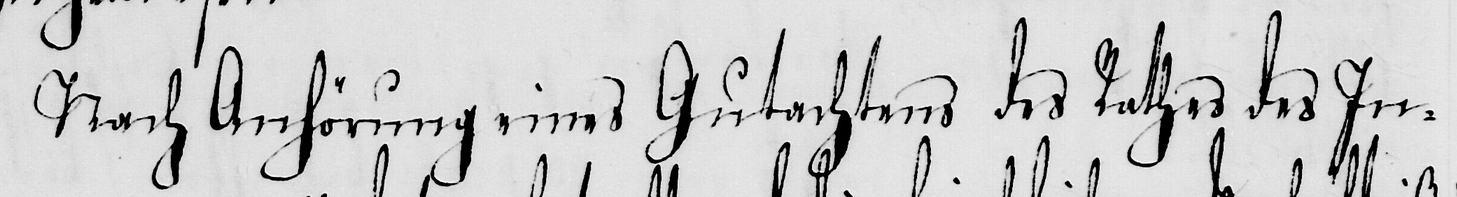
Nach Anhörung eines Gutachtens des Rathes des In¬
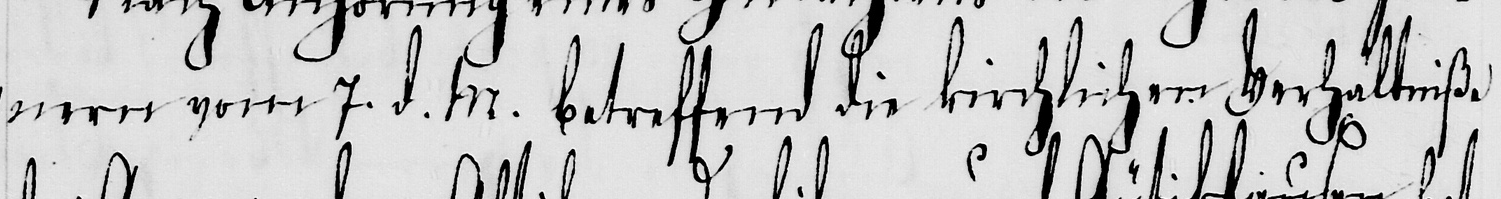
nern vom 7. d. M. betreffend die kirchlichen Verhältniße
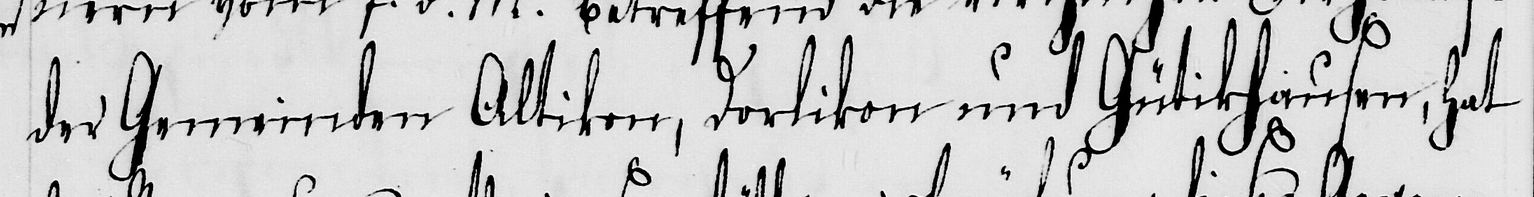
der Gemeinden Altikon, Dorlikon und Gütikhausen, hat
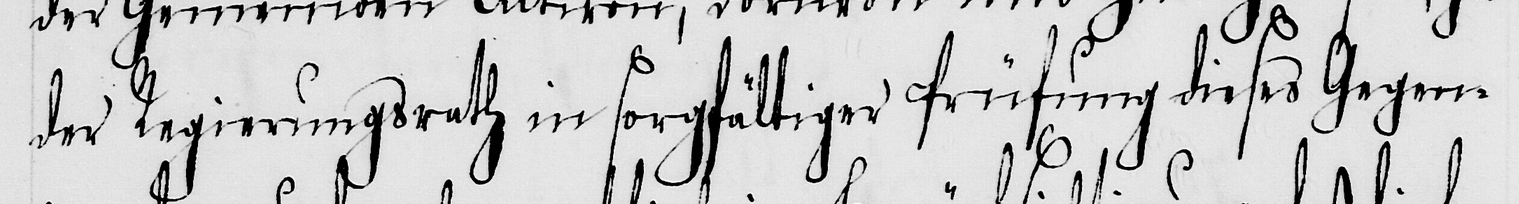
der Regierungsrath in sorgfältiger Prüfung dieses Gegen¬
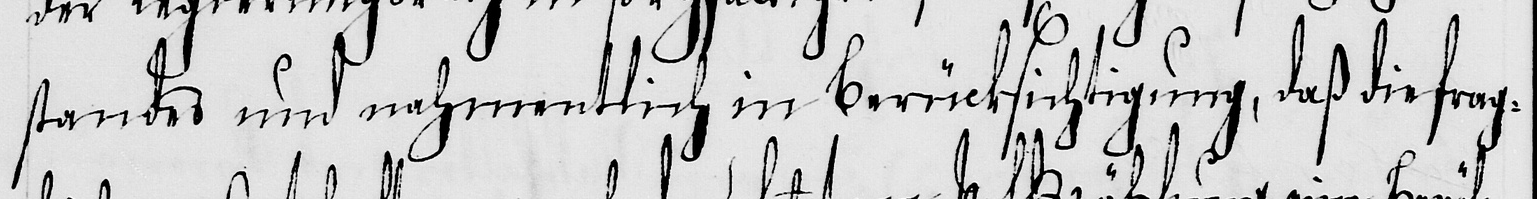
standes und nahmentlich in Berücksichtigung, daß die frag¬
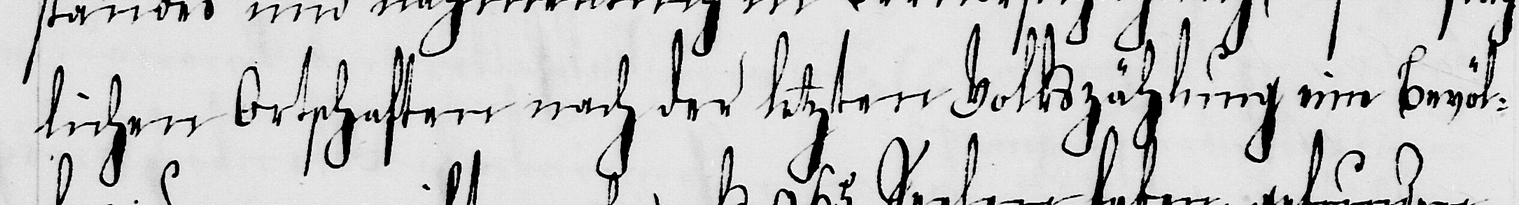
lichen Ortschaften nach der letzten Volkszählung eine Bevö¬
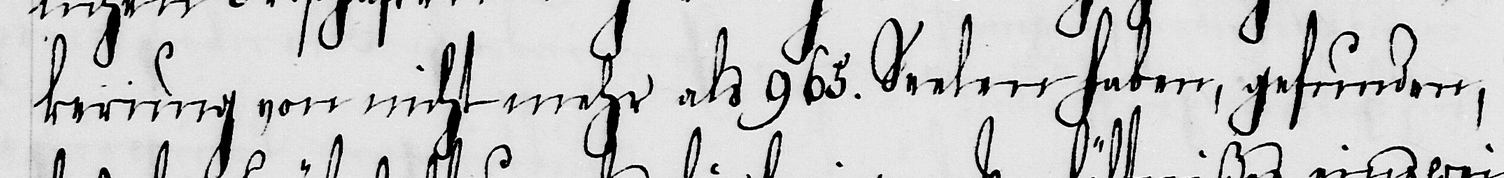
lkerung von nicht mehr als 965. Seelen haben, gefunden,
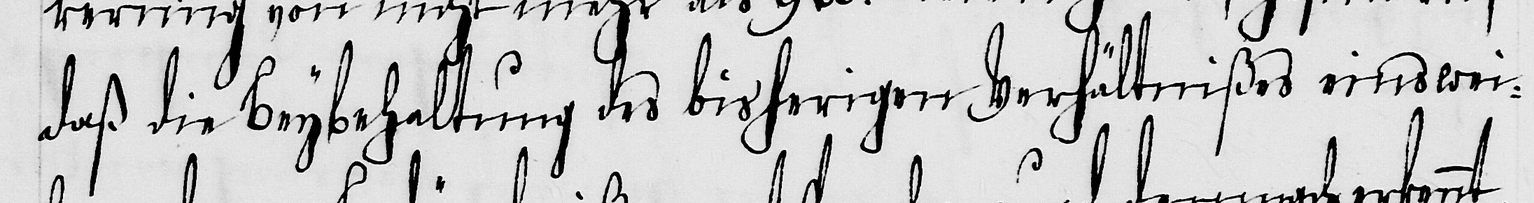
daß die Beybehaltung des bisherigen Verhältnißes einswei¬
